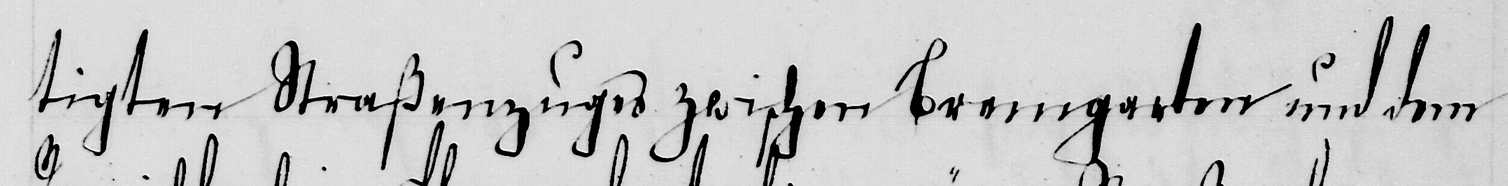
tigten Straßenzuges zwischen Bremgarten und dem
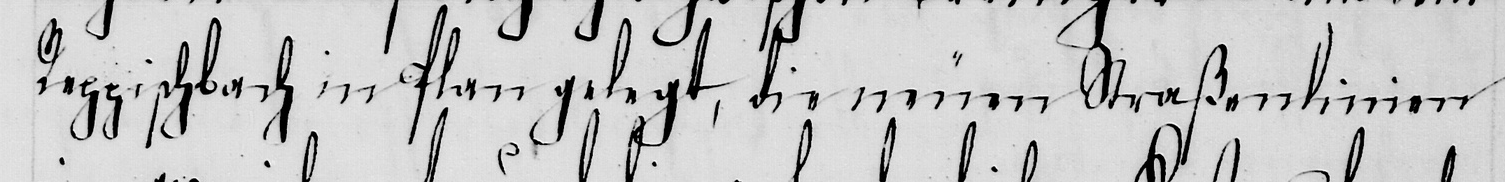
Reppischbach in Plan gelegt, die neuen Straßenlinien
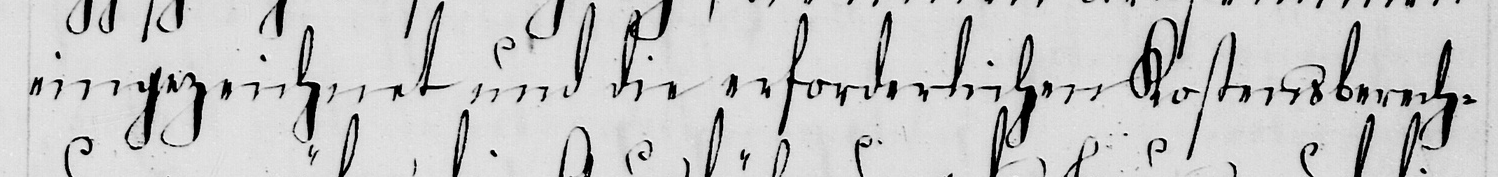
eingezeichnet und die erforderlichen Kostensberech¬
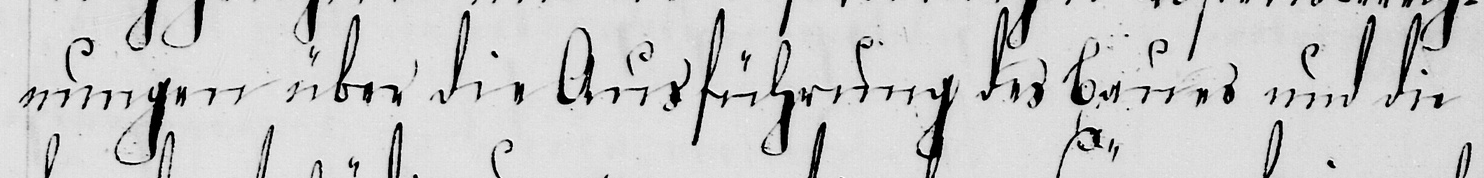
nungen über die Ausführung des Baues und die
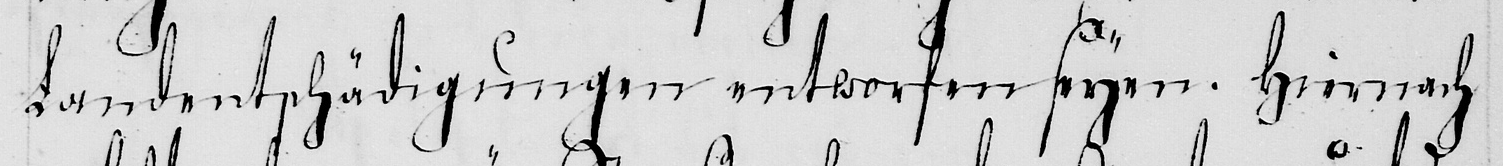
Landentschädigungen entworfen seyen. Hiernach
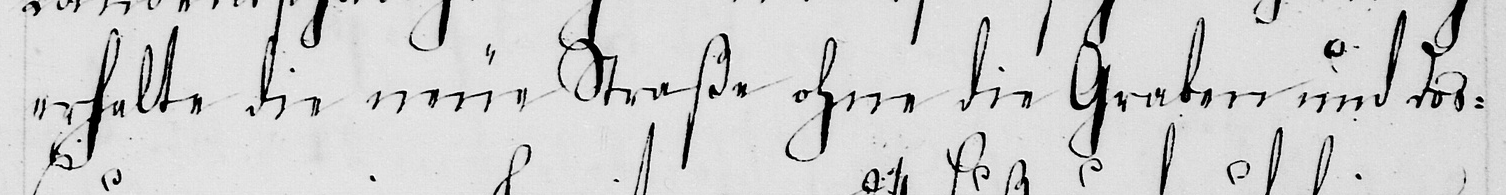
erhalte die neue Straße ohne die Graben und Do¬
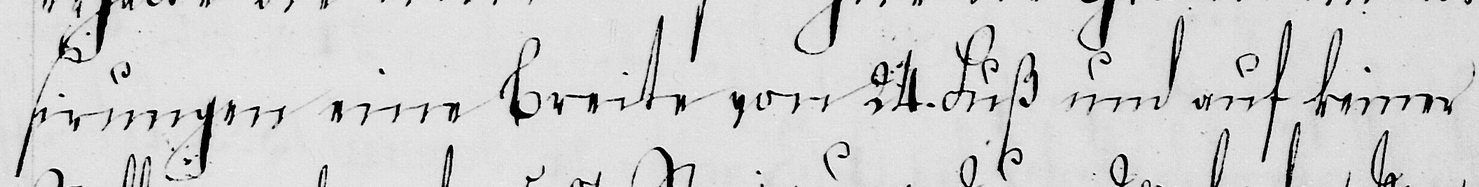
ßierungen eine Breite von 24. Fuß und auf keiner
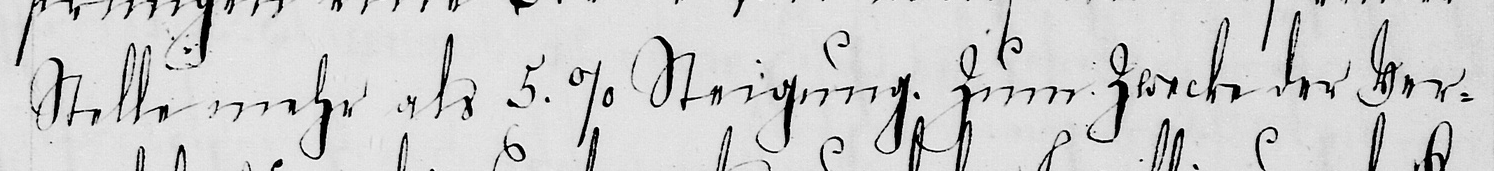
Stelle mehr als 5. % Steigung. Zum Zwecke der Ver¬
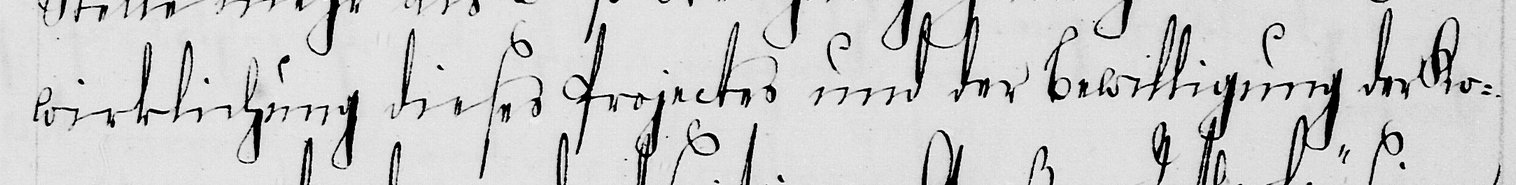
wirklichung dieses Projectes und der Bewilligung der Ko¬
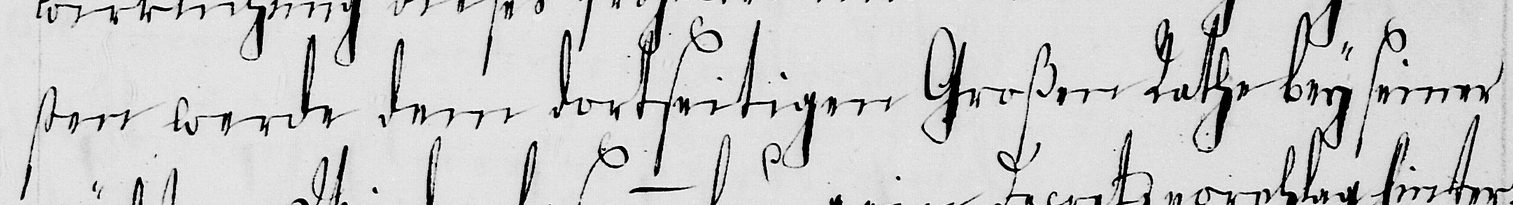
sten werde dem dortseitigen Großen Rathe bey seiner
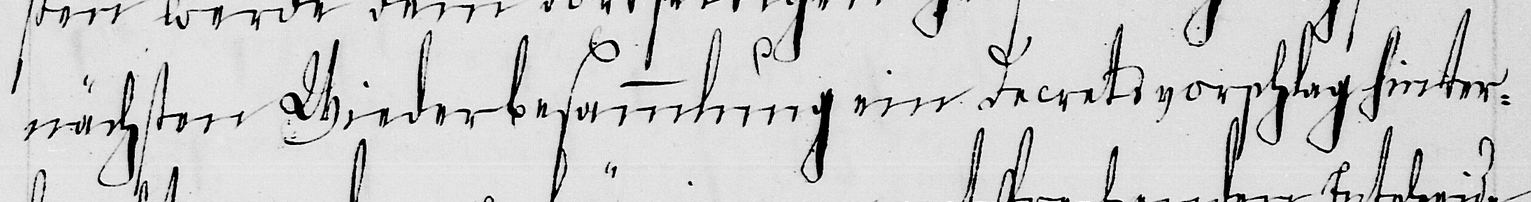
nächsten Wiederbesammlung ein Decretsvorschlag hinter¬
